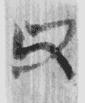父
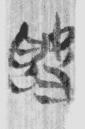既
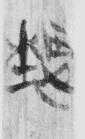執
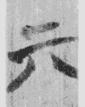亓
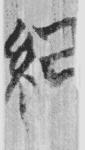紀
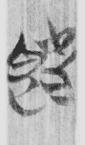既
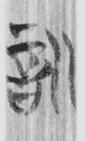訓
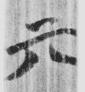亓
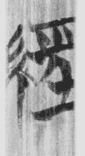經
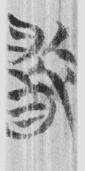敢
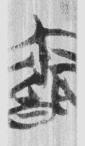{尒䎽}
